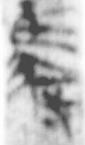馭（御）
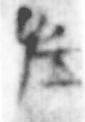○（左）
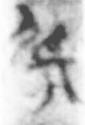○（殿）
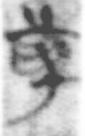革
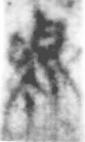綏
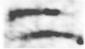二
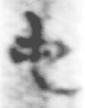屯
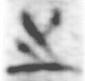之
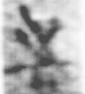之
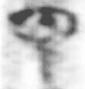四
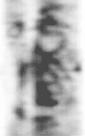○（箙）
